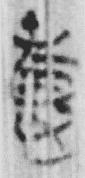惪（德）
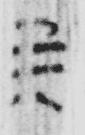而
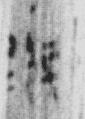母
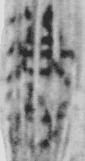○（偽）
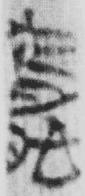慮
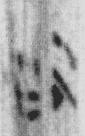谷（欲）
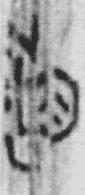淵
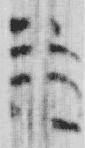而
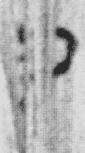母
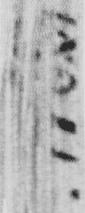異
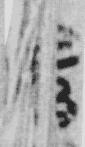退
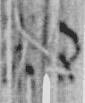谷（欲）
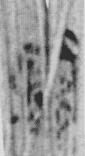繍（肅）
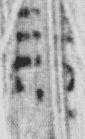而
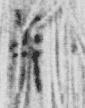母
